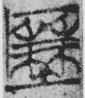○（謙）
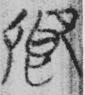卿（亨）
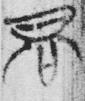君
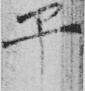子
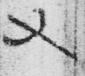又（有）
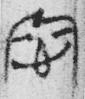㤏（終）
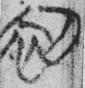初
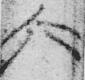六
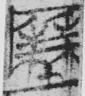○（謙）
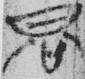君
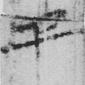子
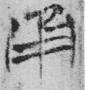甬（用）
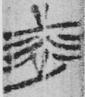涉
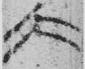大
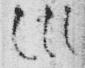川
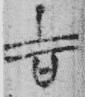吉
